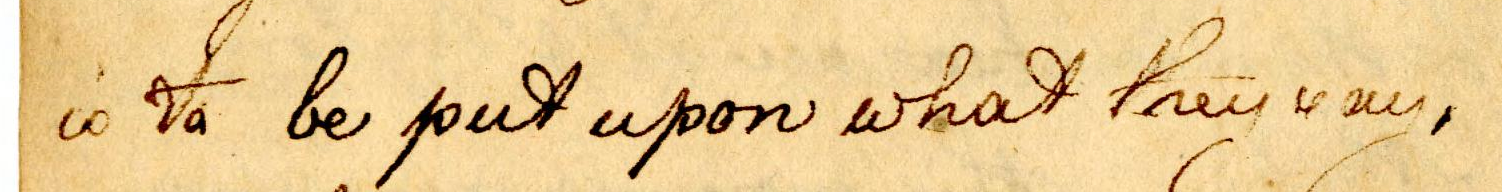is to be put upon what they say,
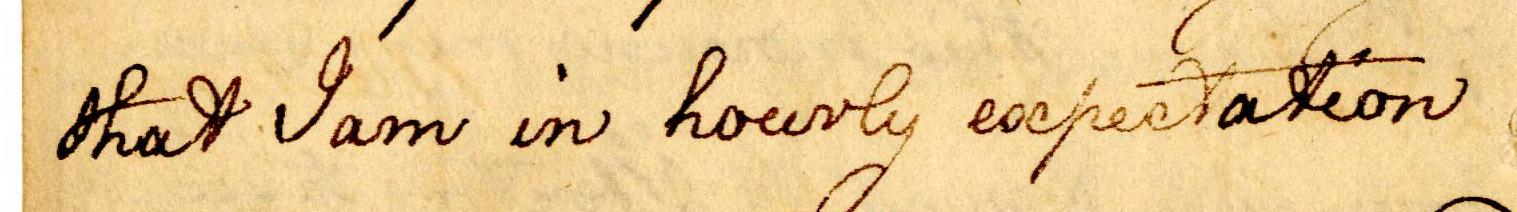that I am in hourly expectation
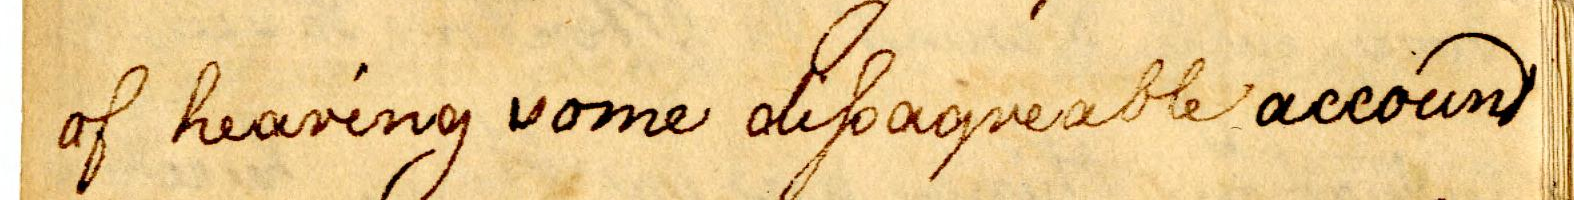of hearing some dissagreable account
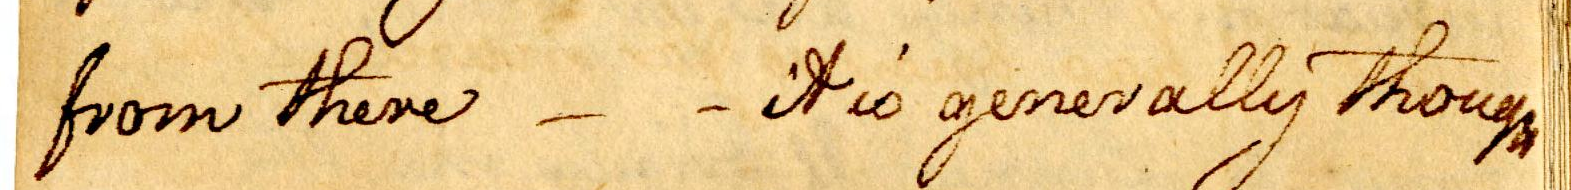from there-- it is generally thoug
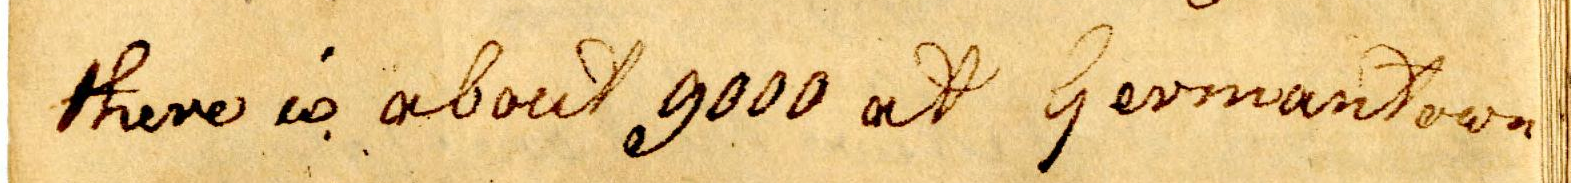there is about 9000 at Germantown
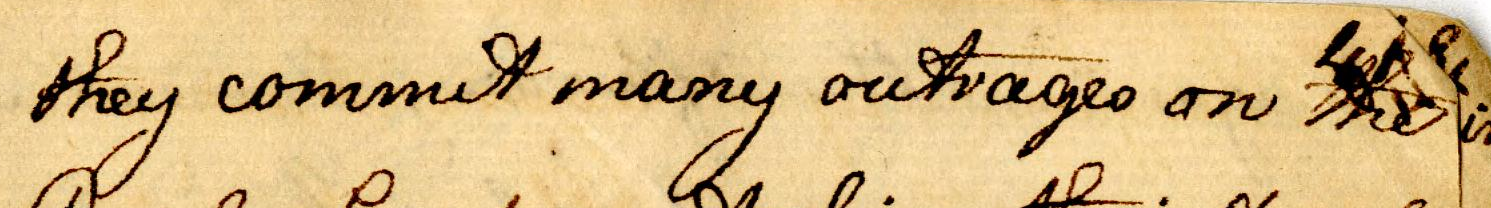they commit many outrages on the
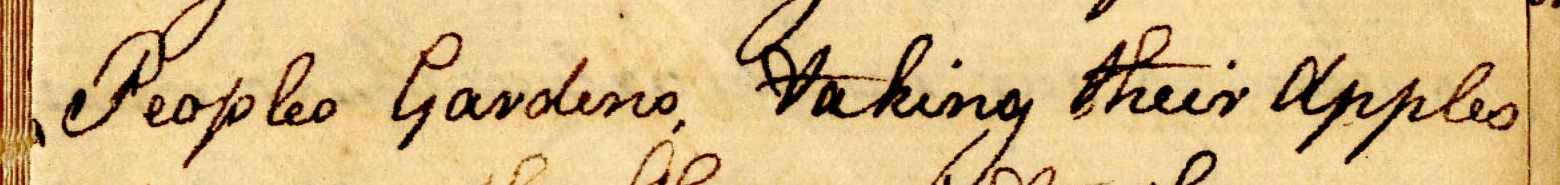Peoples Gardens, taking their Apples
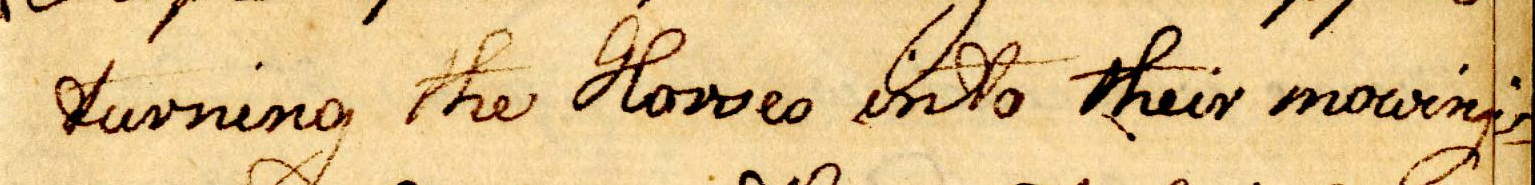turning the Horses into their mowing
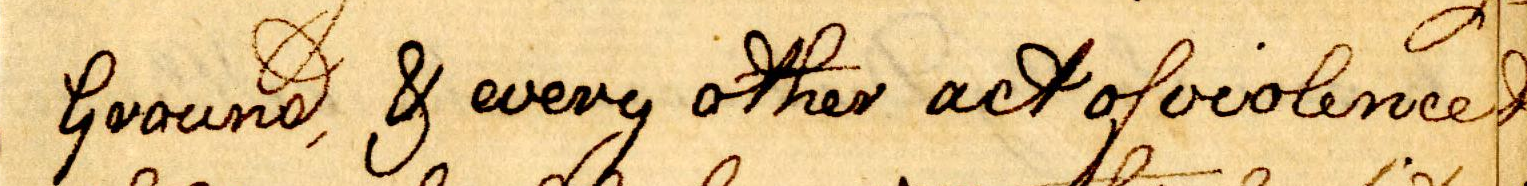Ground, & every other act of violence
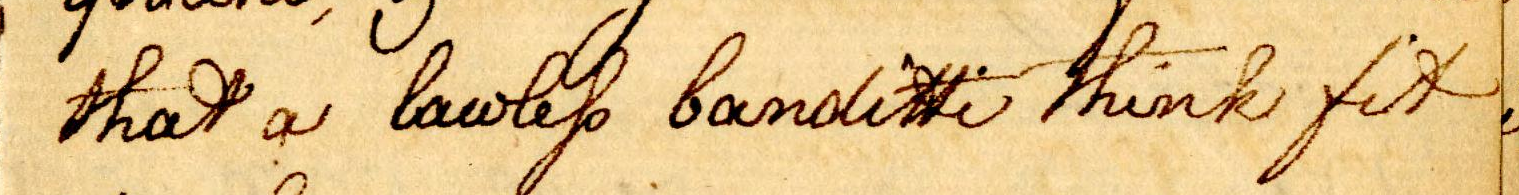that a lawless banditti think fit
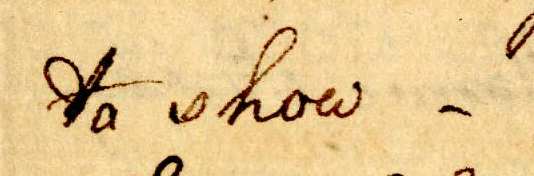to show-
